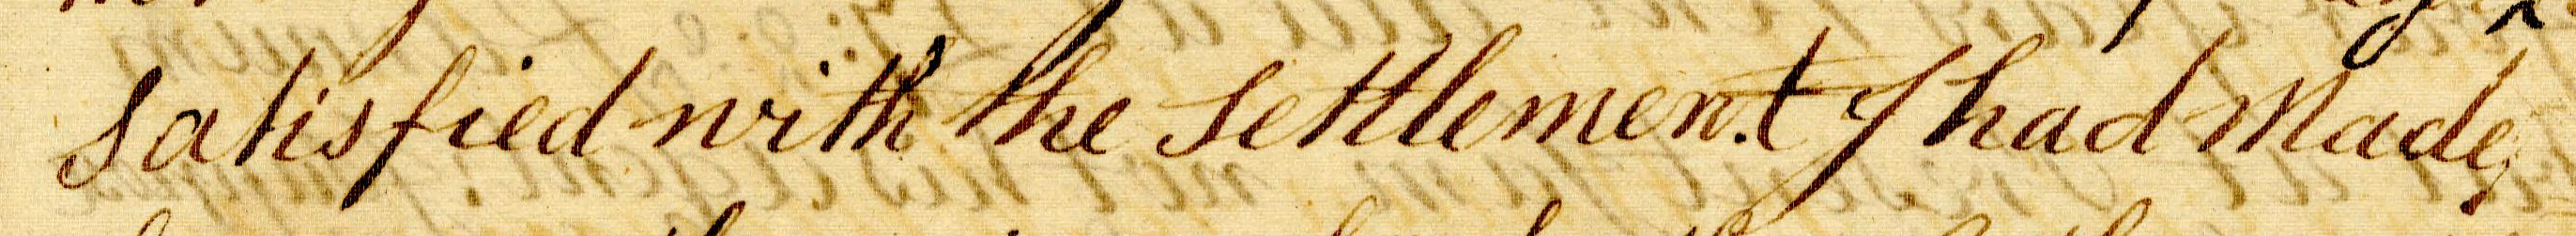satisfied with the settlement I had Made,
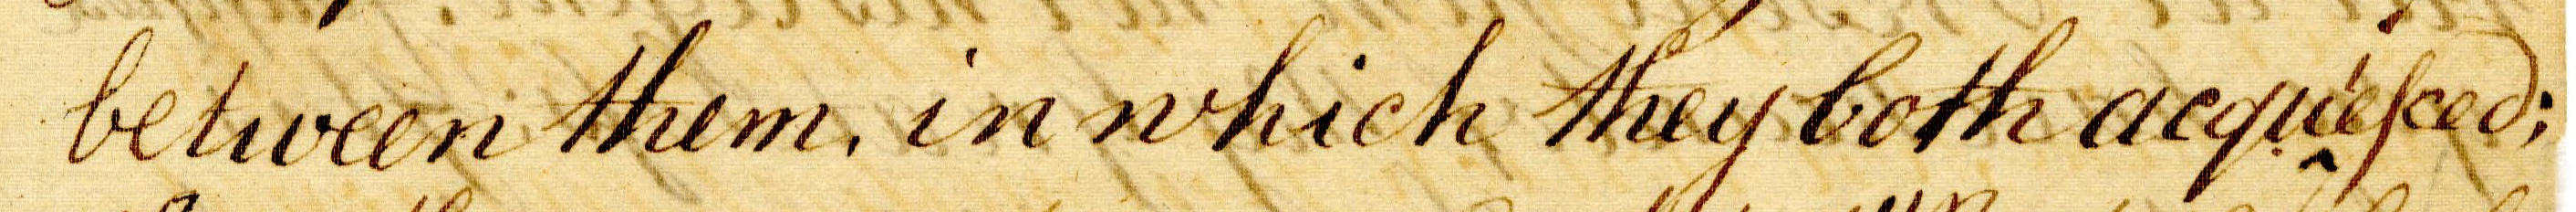between them, in which they both acqu^iesced;
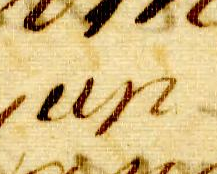up
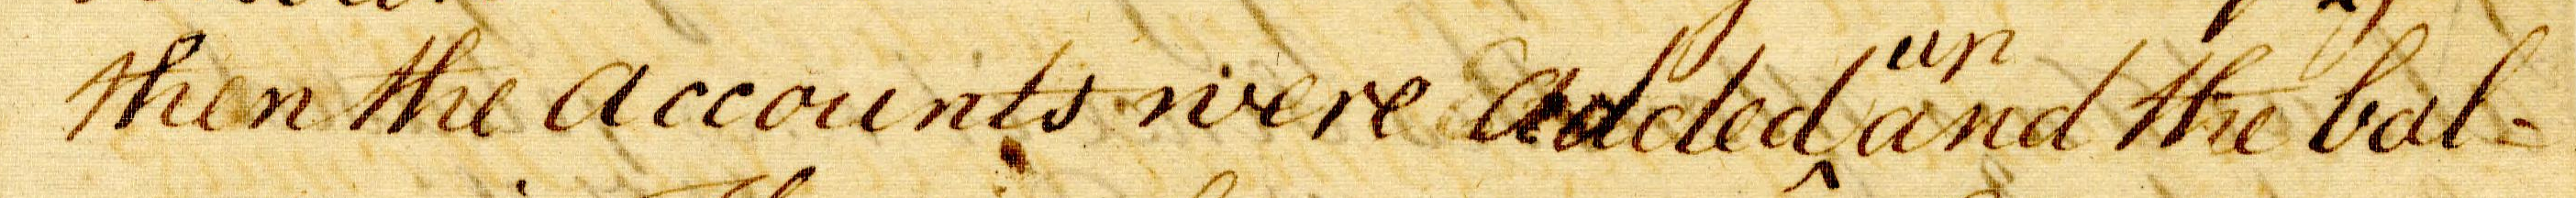then the Accounts were Added^ and the bal-
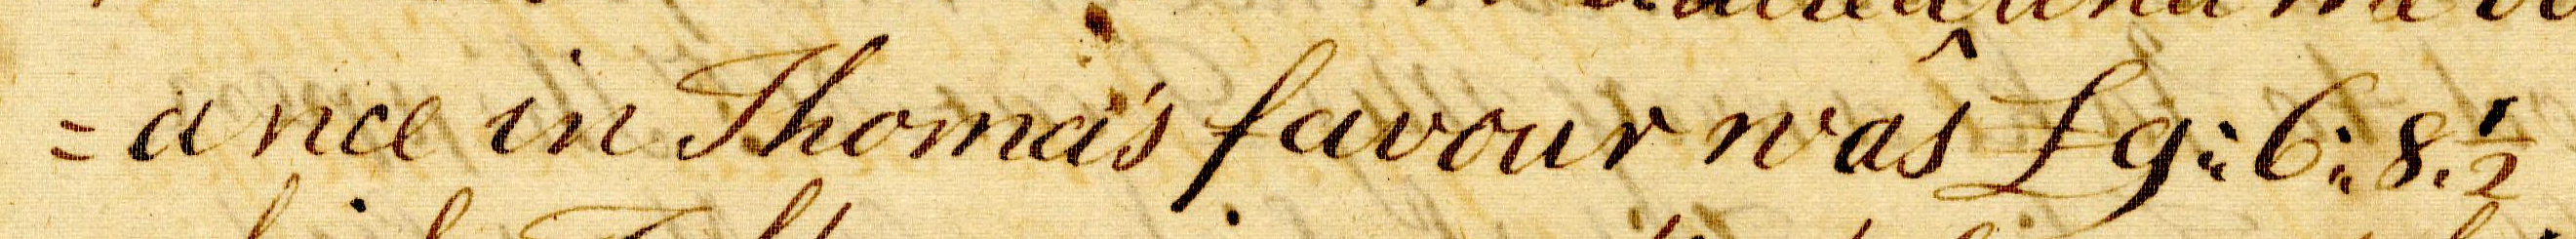-ance in Thoma's favour was £0:.6:.8. 1/2
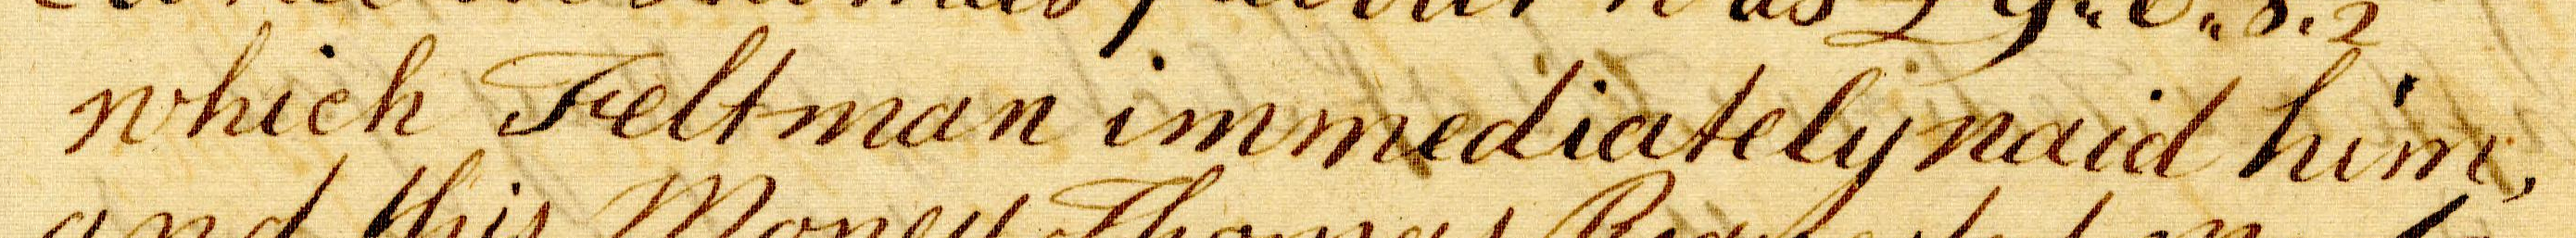which Feltman immediately paid him,
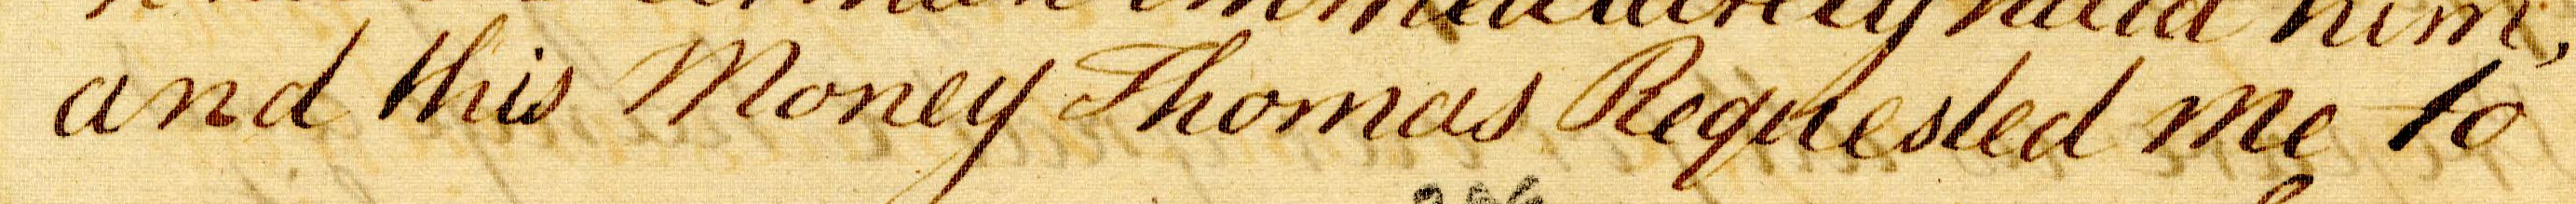and this Money Thomas Requested Me to
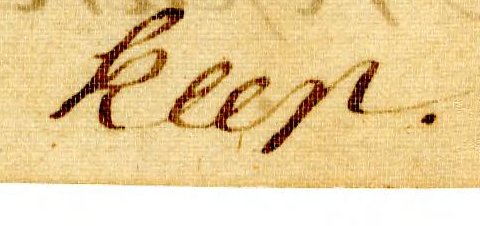keep.
